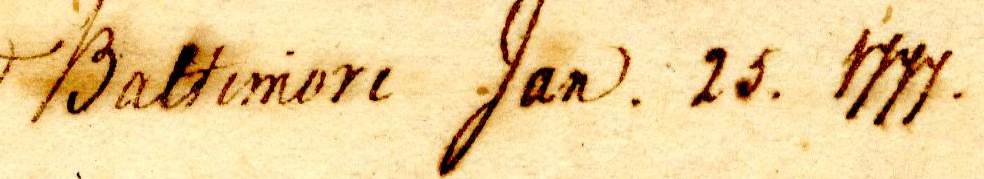Baltimore Jan. 25. 1777.
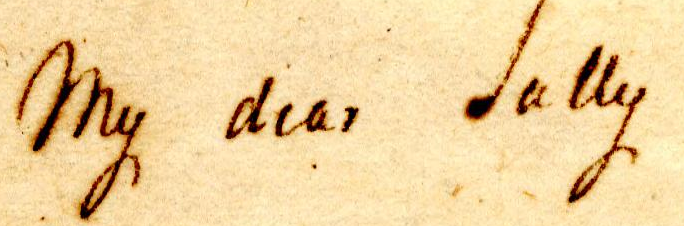My dear Sally
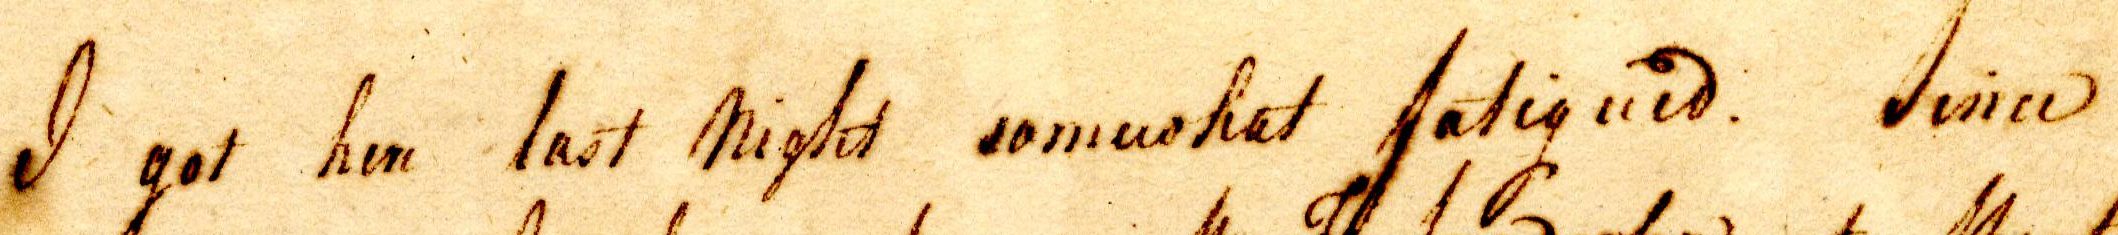I got here last Night somewhat fatigued. Since
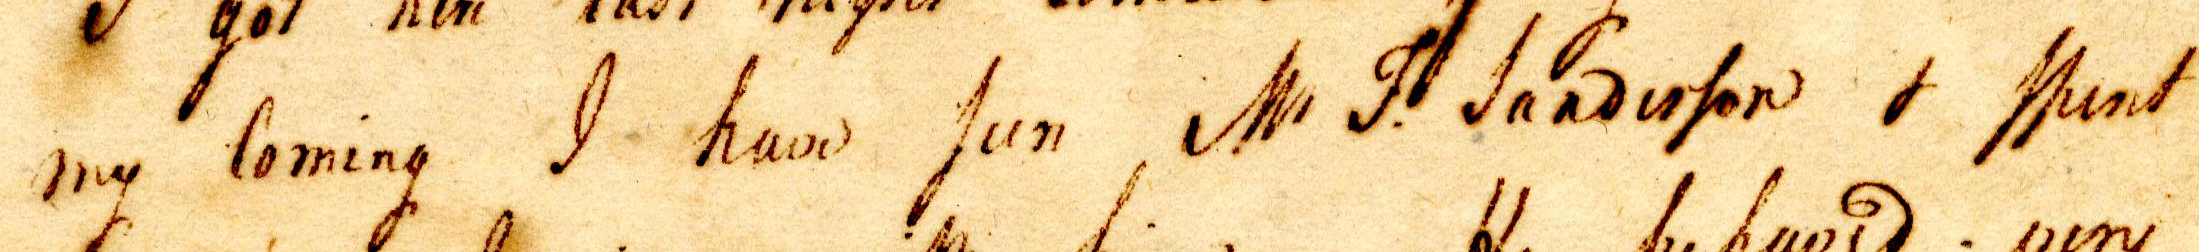my coming I have seen M^r F. Sanderson & spent
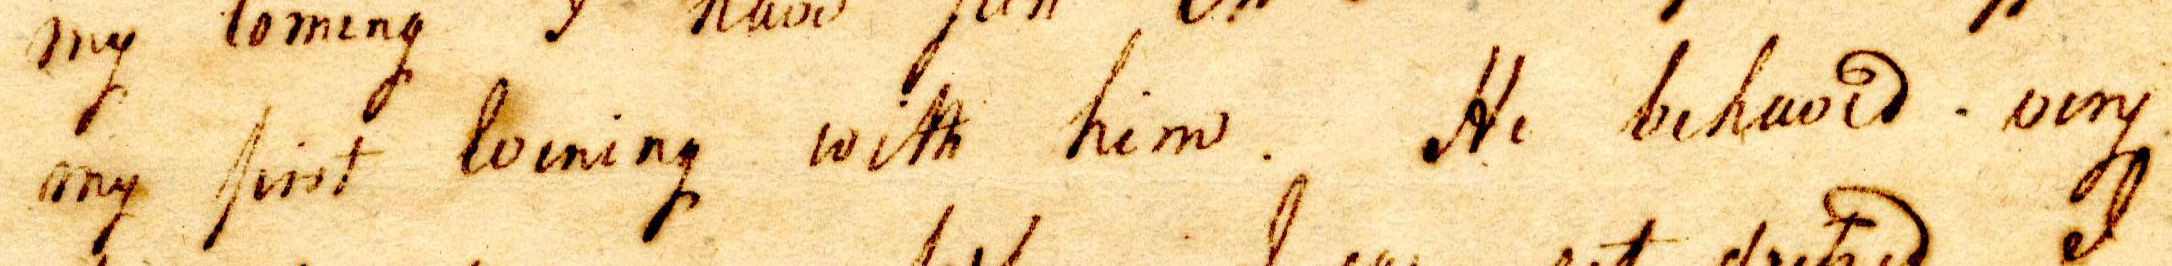my first Evening with him. He behaved very
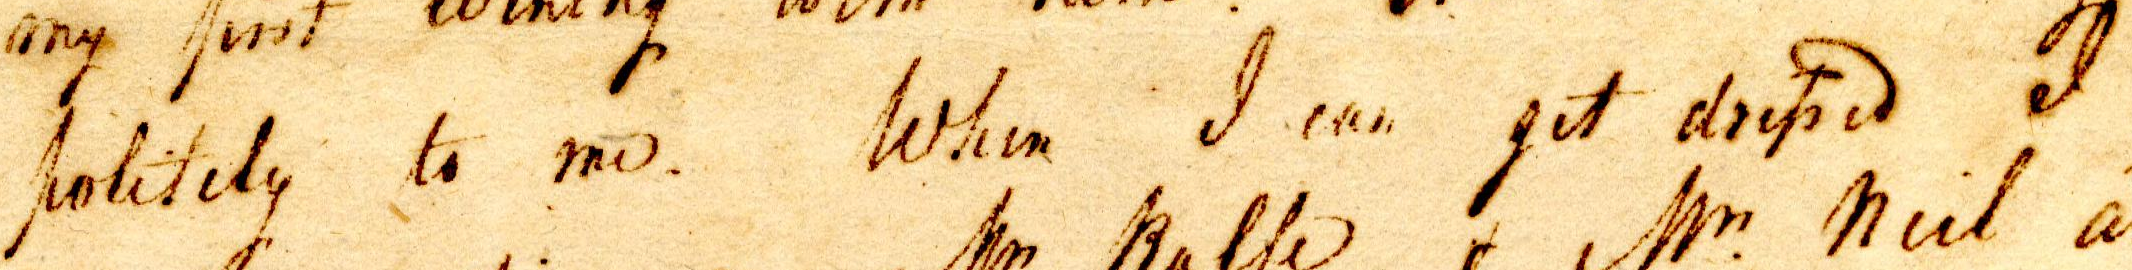politely to me. When I can get dressed I
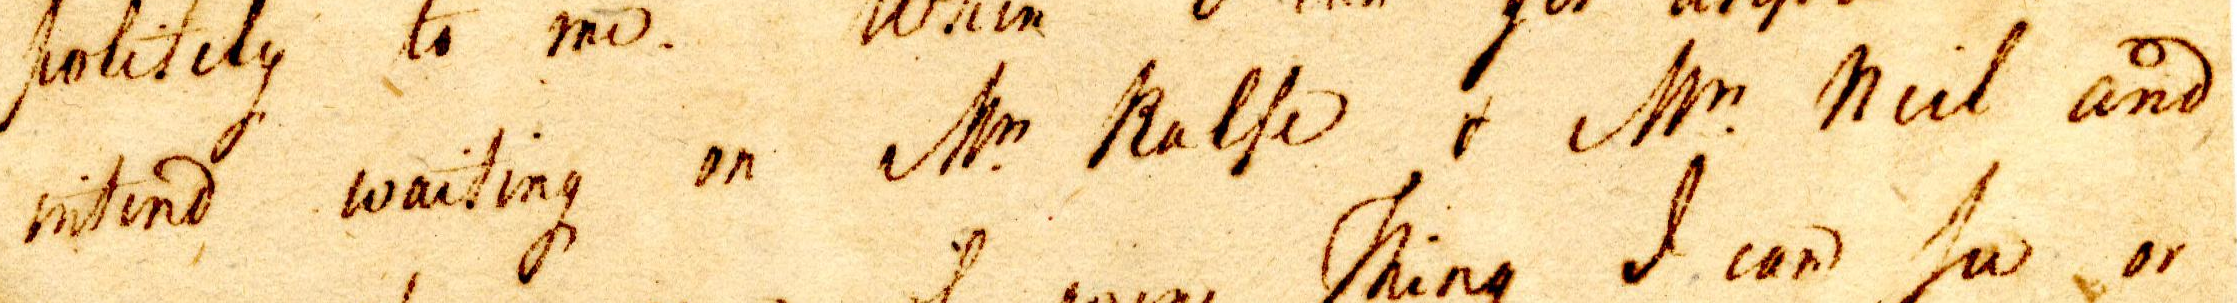intend waiting on M^r. Ralfe & M^r. Neil and
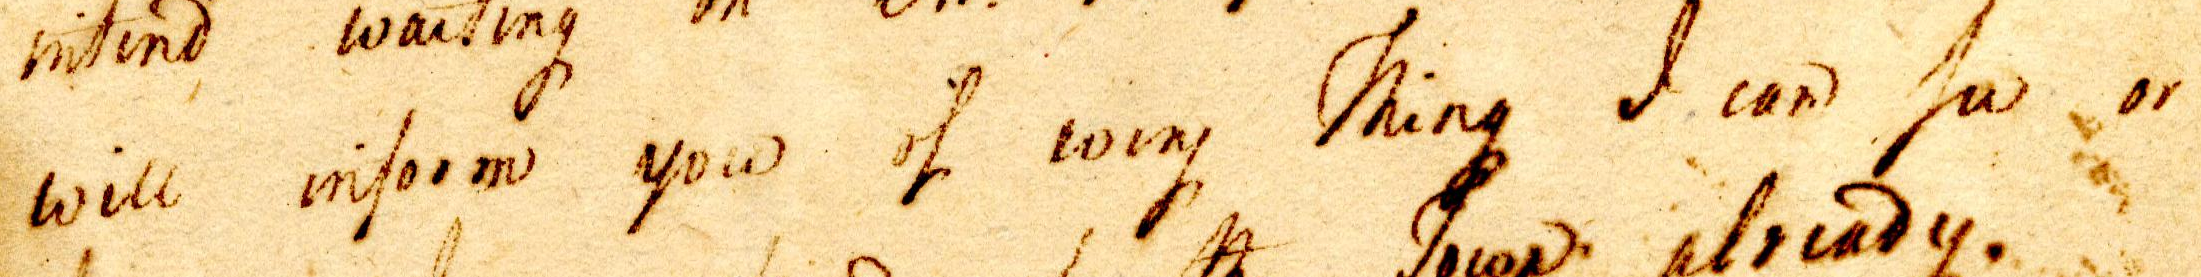will inform you of every thing I can see or
